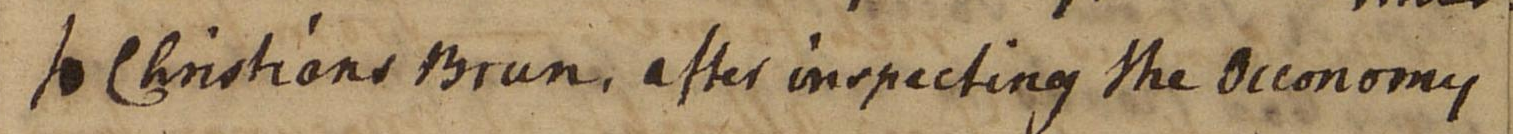to Christians Brun, after inspecting the Occonomy
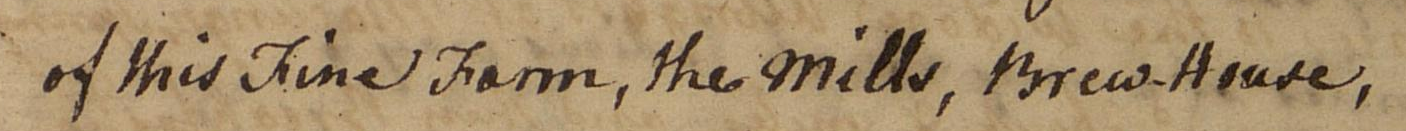of this Fine Farm, the Mills, Brew-House,
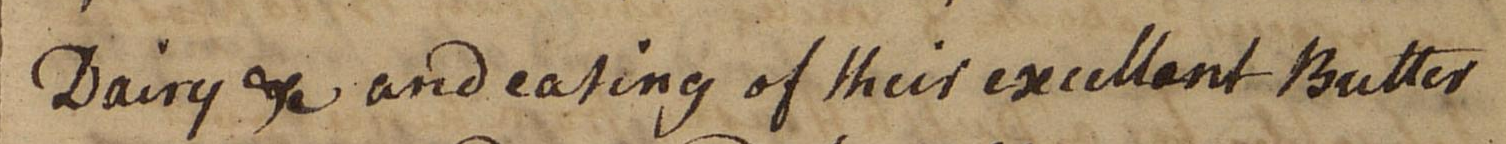Dairy &c and eating of their excellent Butter
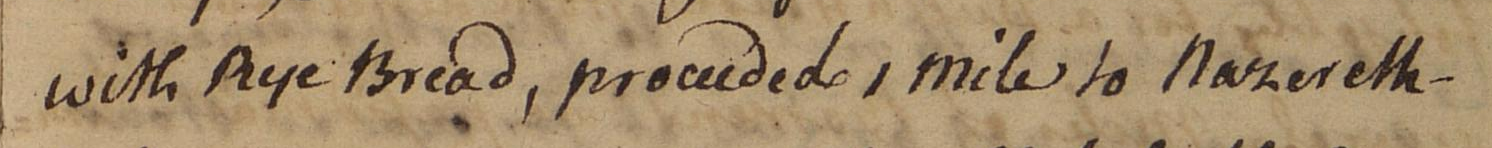with Rye Bread, proceeded 1 Mile to Nazereth-
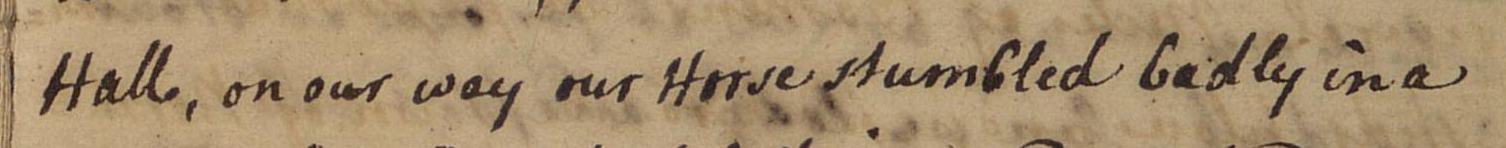Hall, on our way our Horse stumbled badly in a
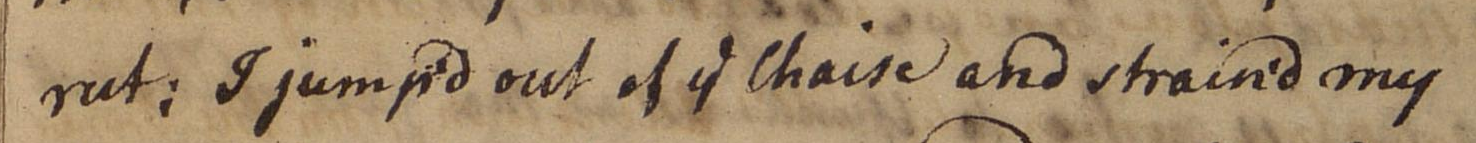rut; I jump'd out of y^e Chaise and strain'd my
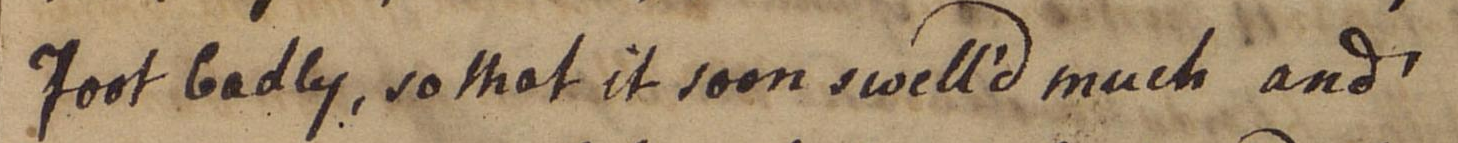foot badly, so that it soon swell'd much and
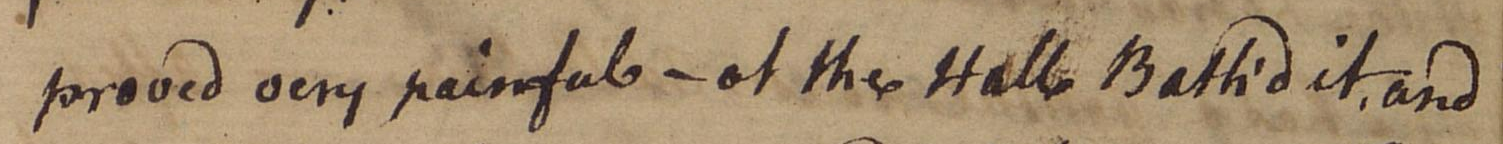proved very painful- at the Hall Bath'd it, and
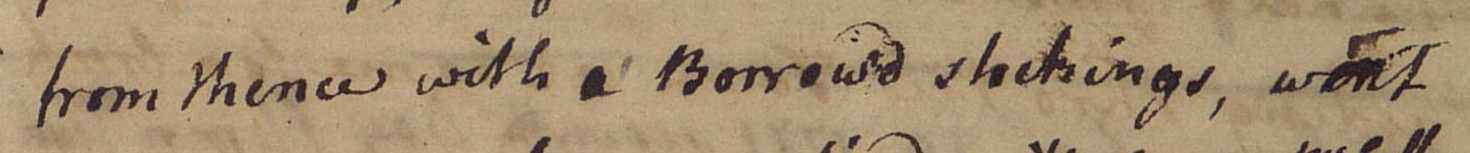from thence with a Borrow'd stockings, went
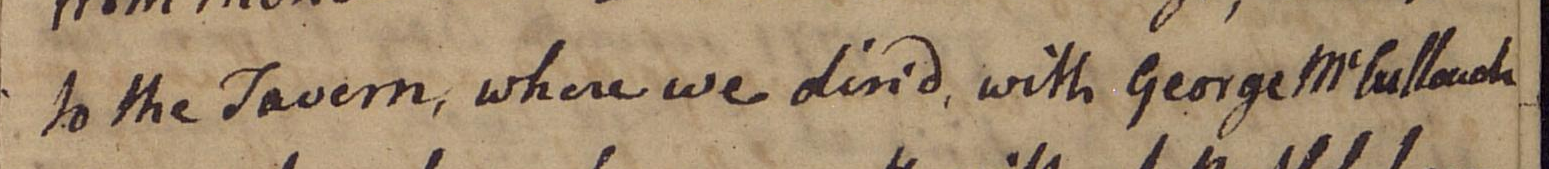to the Tavern, where we din'd, with George M^c Cullouch
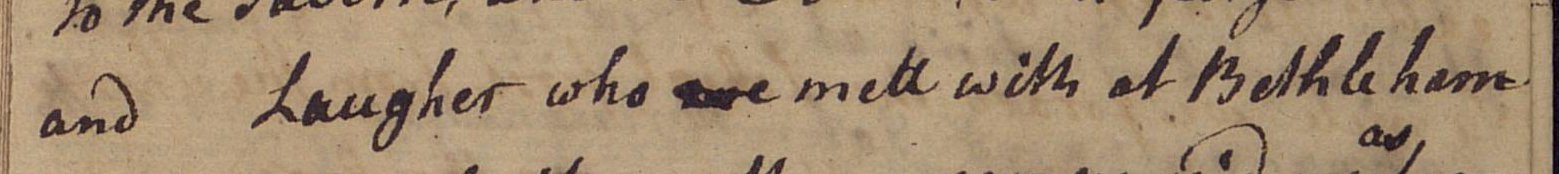and Laugher who we mett with at Bethleham
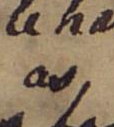as
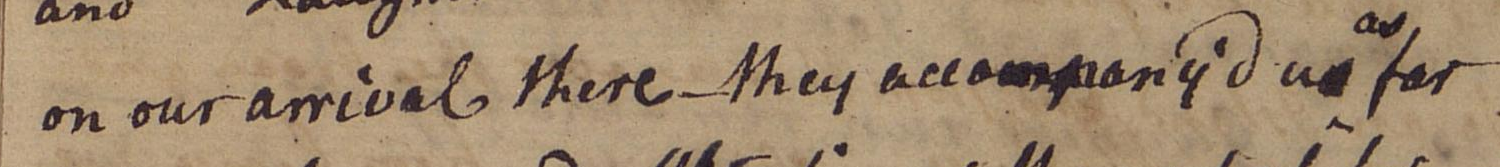on our arrival there- they accoumpany'd us ^ far
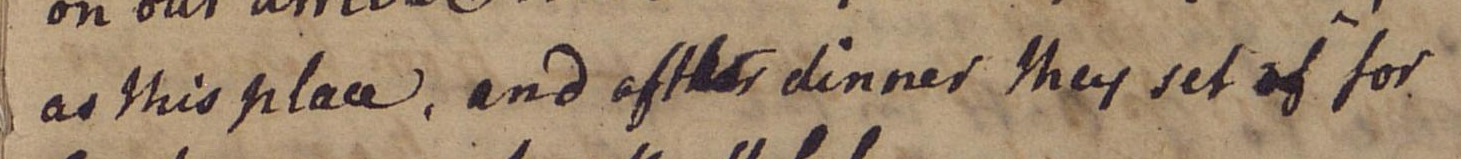as this place, and after dinner they set of for
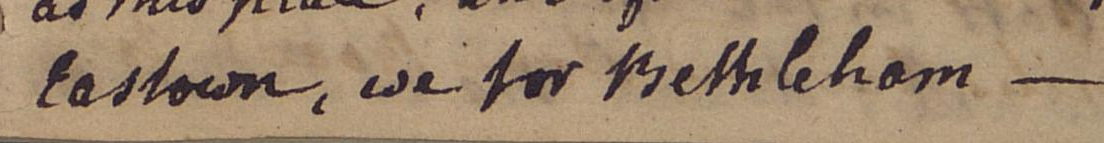Eastown, we for Bethleham-
